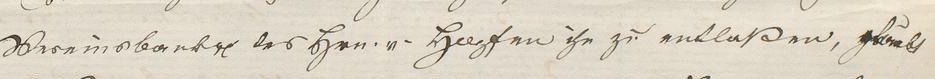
Vereinsbank & des Hrn. v. Hopfen ihn zu entlaßen, glaubt
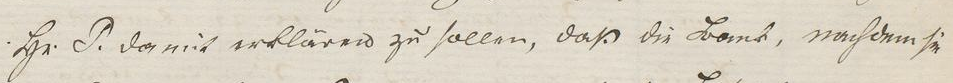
Hr. P. damit erklären zu sollen, daß die Bank, nachdem sie
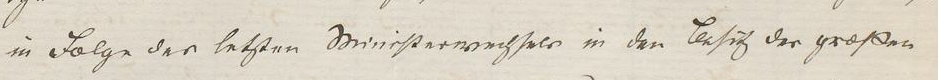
in Folge des letzten Ministerwechsels in den Besitz der großen
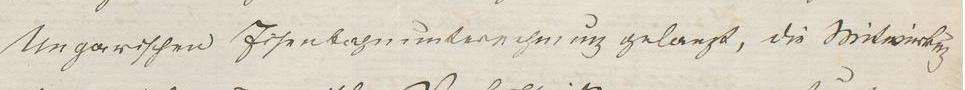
Ungarischen Eisenbahnunternehmung gelangt, die Mitwirkung
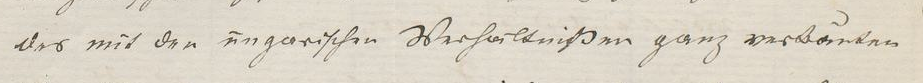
des mit den ungarischen Verhältnißen ganz vertrauten
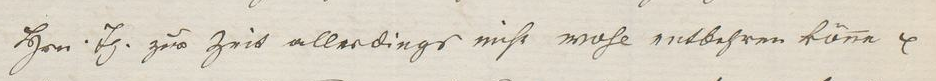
Hrn. Th. zur Zeit allerdings nicht wohl entbehren könne &
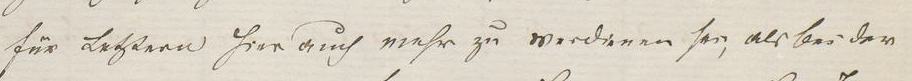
für Letztern hier auch mehr zu verdienen sei, als bei der
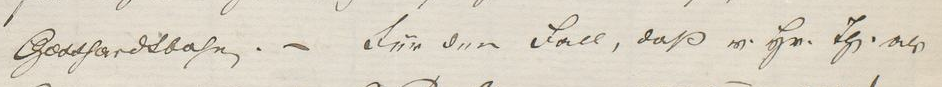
Gotthardtbahn. – Für den Fall, daß v. Hr. Th. als
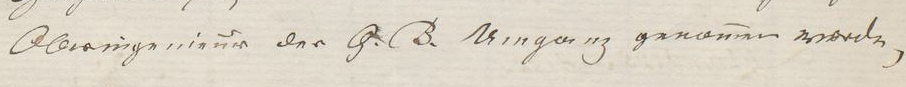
Oberingenieur der G.B. Umgang genommen werde,
